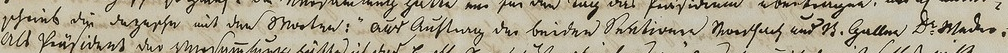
schrieb die Depesche mit den Worten: «Aus Auftrag der beiden Sektionen Rorschach und St. Gallen Dr Weder.»
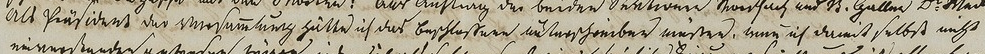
Als Präsident der Versammlung hätte ich das Beschloßene unterschreiben müßen, wenn ich damit selbst nicht
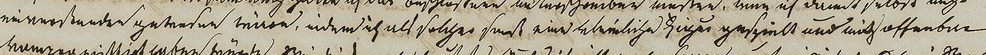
einverstanden gewesen wäre, indem ich als solcher sonst eine kleinliche Figur gespielt und mich offenbar
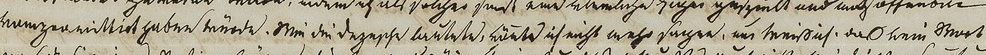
kompromittirt haben würde. Wie die Depesche lautete, könnte ich nicht mehr sagen, nur weiß ich, daß kein Wort
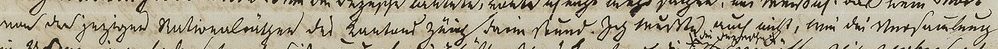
von den jezigen Nationalräthen des Kantons Zürich darin stand. Ich wußte auch nicht, wie die Versammlung
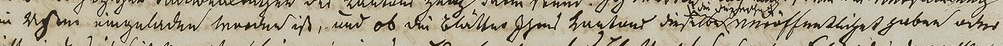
in Uster eingeladen worden ist, und ob die Blätter Ihres Kantons dieselbe (die Depesche) veröffentlichet haben oder
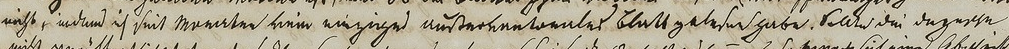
nicht, indem ich seit Monaten kein einziges außerkantonales Blatt gelesen habe. Sollte die Depesche
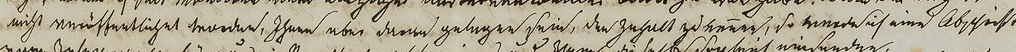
nicht veröffentlichet werden, Ihnen aber daran gelegen sein, den Inhalt zu kennen, so werde ich eine Abschrift
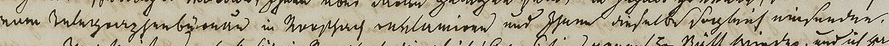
vom Telegraphenbüreau in Rorschach reklamiren und Ihnen dieselbe sogleich einsenden.
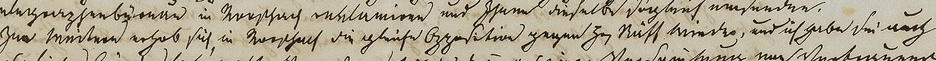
Im Weitern erhob sich in Rorschach die gleiche Opposition gegen Hr. Näff wieder, und ich habe sie auch
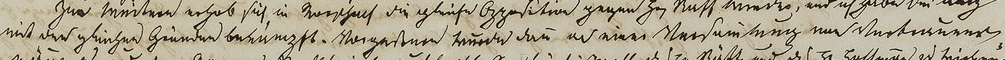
mit den gleichen Gründen bekämpft. Vorgestern wurde dann an einer Versammlung von Vertrauens-
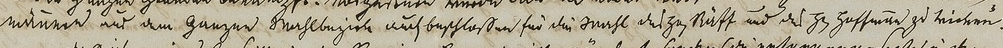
männern aus dem Ganzen Wahlbezirk auch beschloßen für die Wahl des Hr. Näff und des Hr. Hoffmann zu wirken.
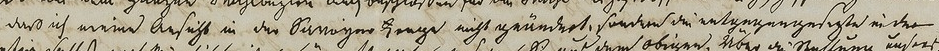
Daß ich meine Ansicht in der Savoyer Frage nicht geändert, sondern die entgegengesezte in der
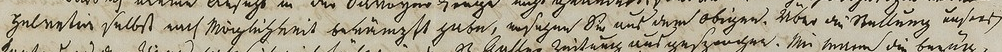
Helvetia selbst nach Möglichkeit bekämpft habe, ersehen Sie aus dem Obigen. Über die Stellung unsres
